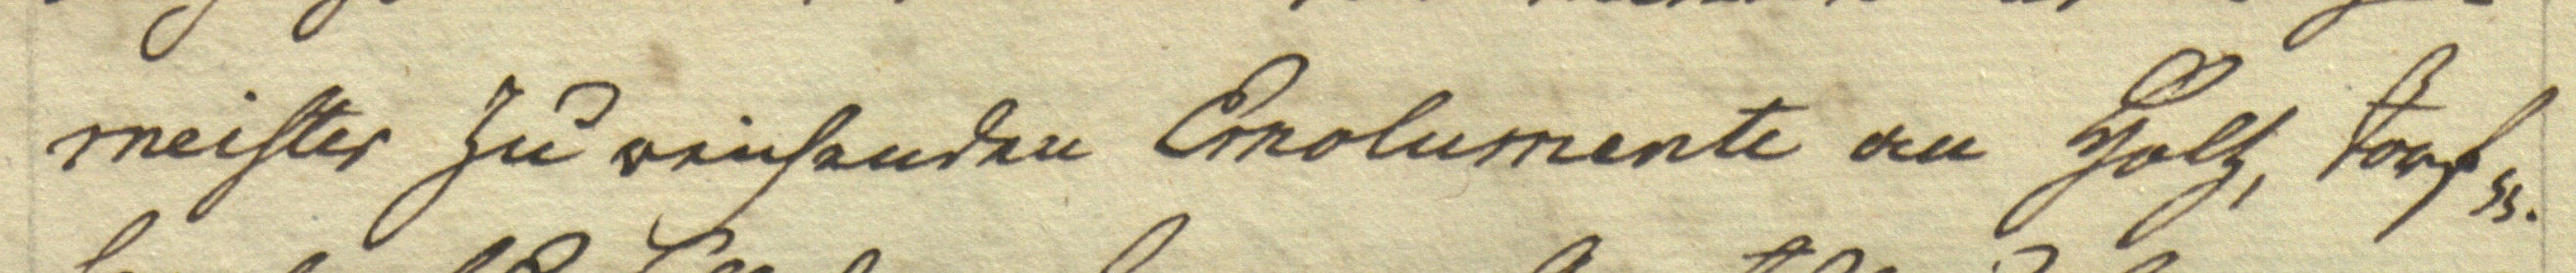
meister zu reichenden Emolumente an Holz, Torf,
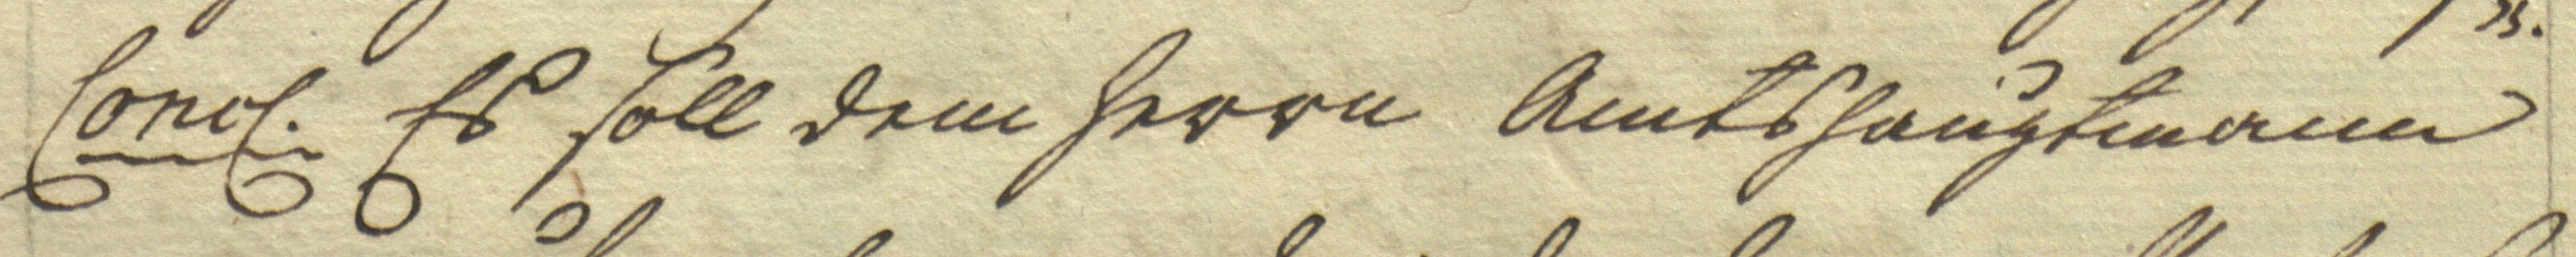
Concl. Es soll dem Herrn Amtshauptmann
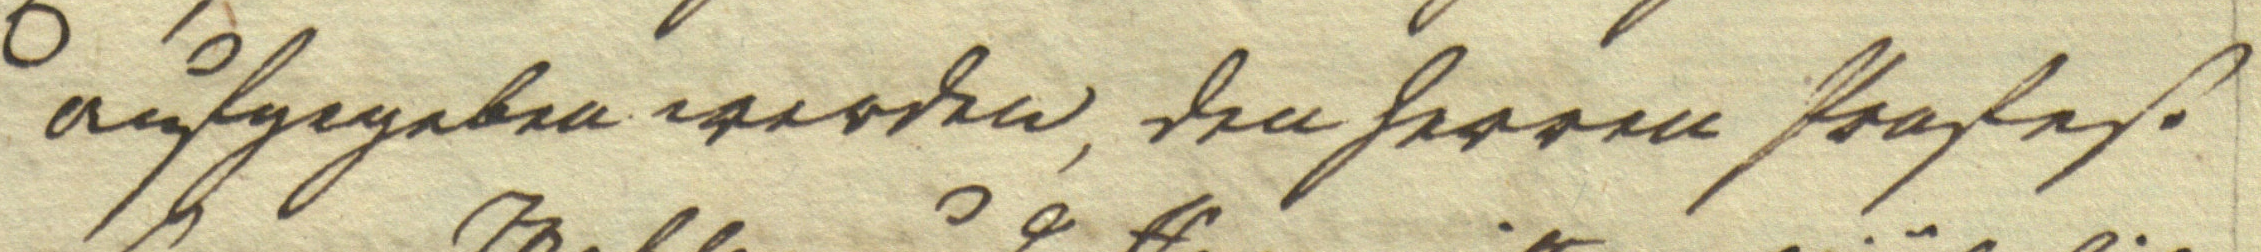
aufgegeben werden, den Herren Profes¬
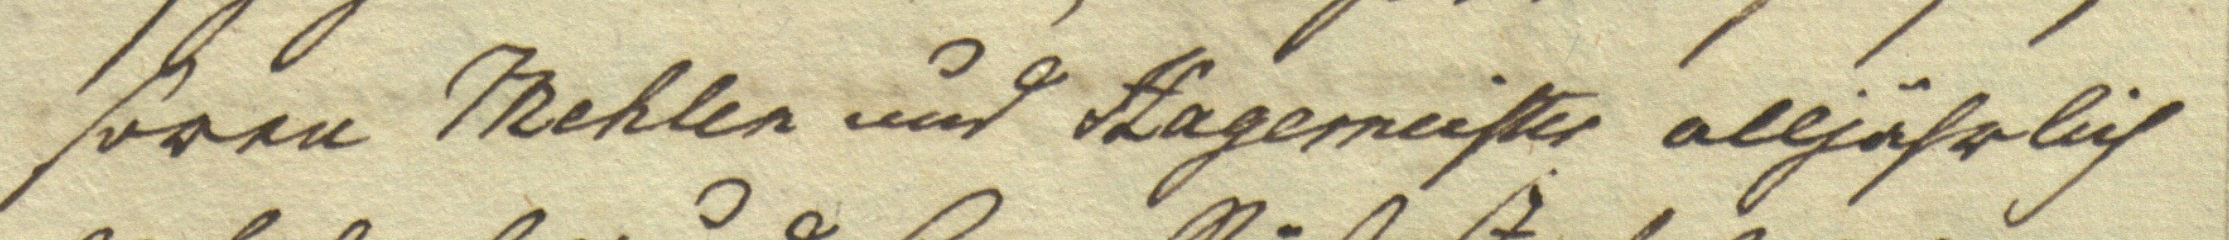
soren Mehlen und Hagemeister alljährlich
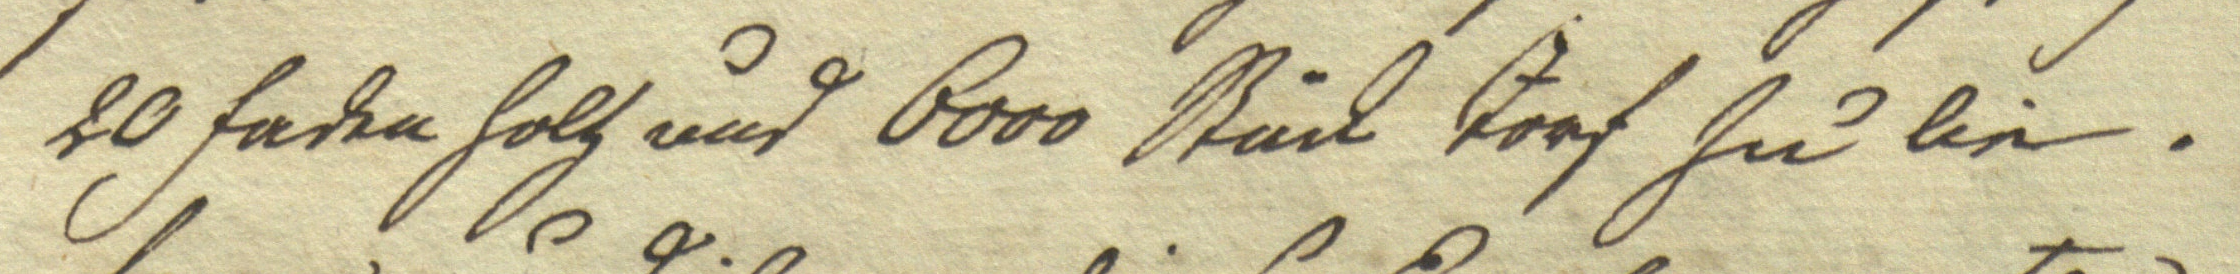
20 Faden Holz und 6000 Stück Torf zu lie¬
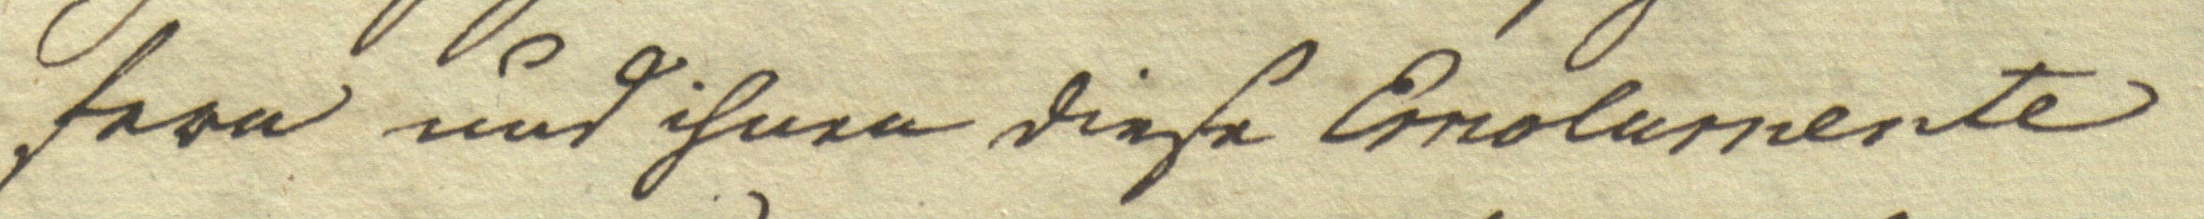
fern und ihnen diese Emolumente
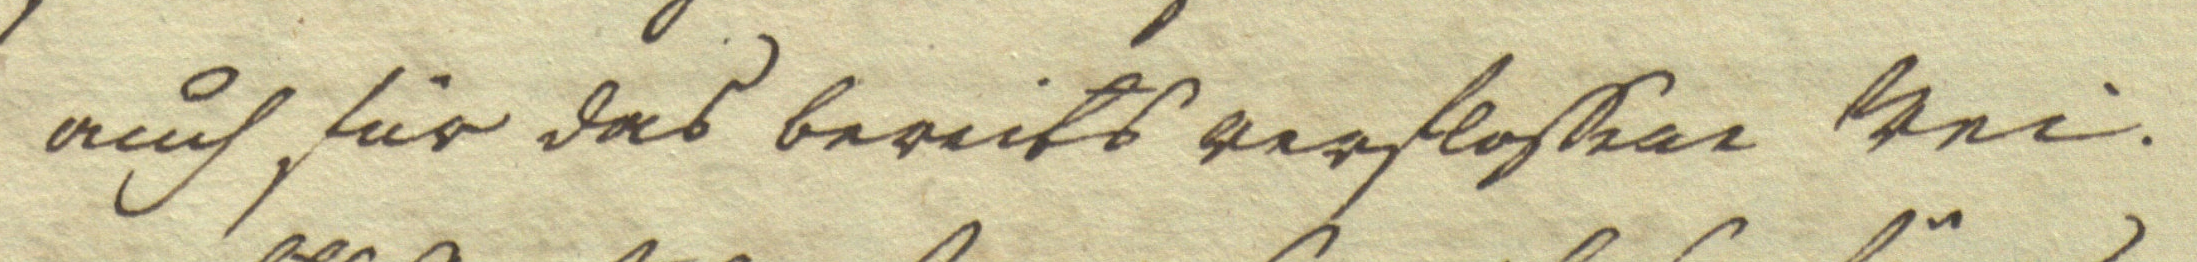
auch für das bereits verflossene Wei¬
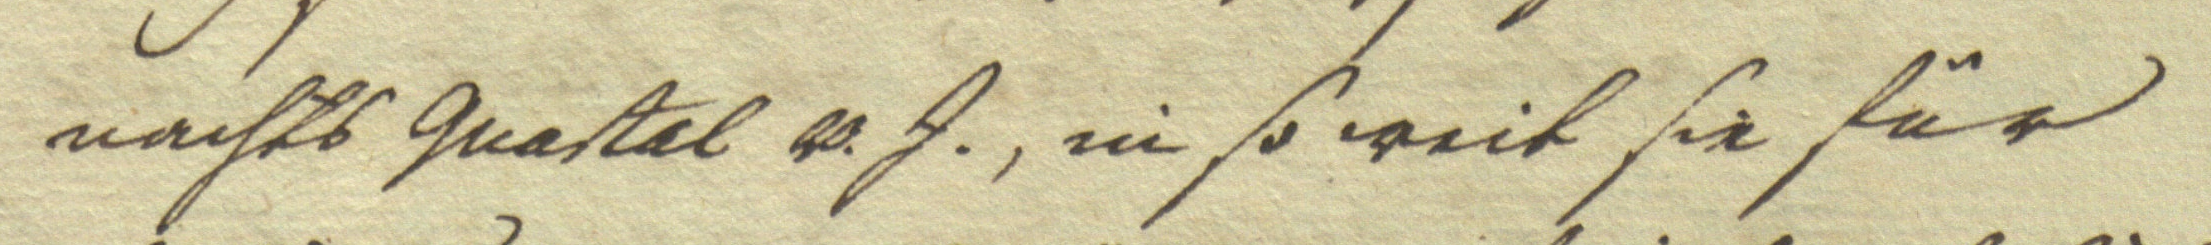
nachts Quartal v. J., in so weit sie für
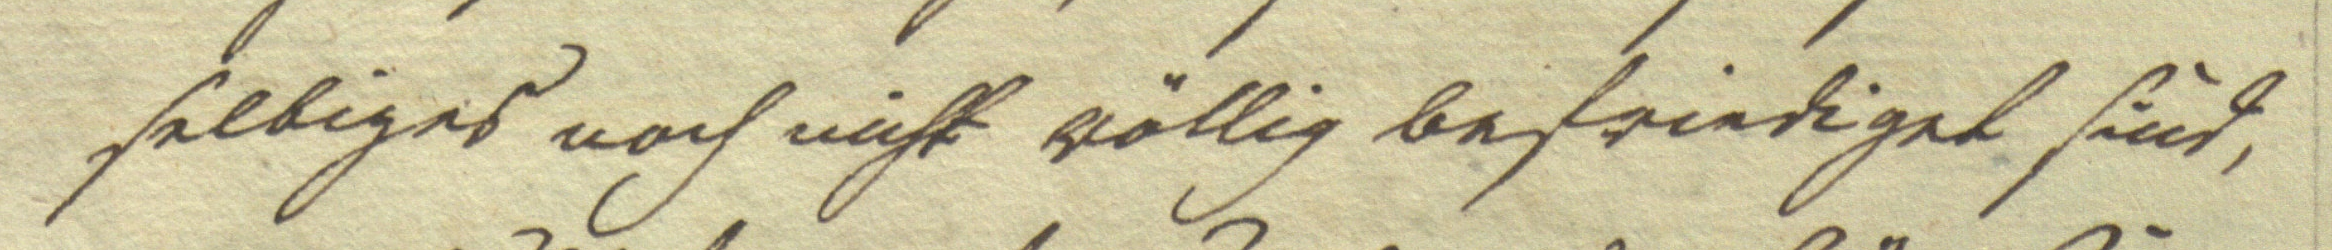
selbige noch nicht völlig befriediget sind,
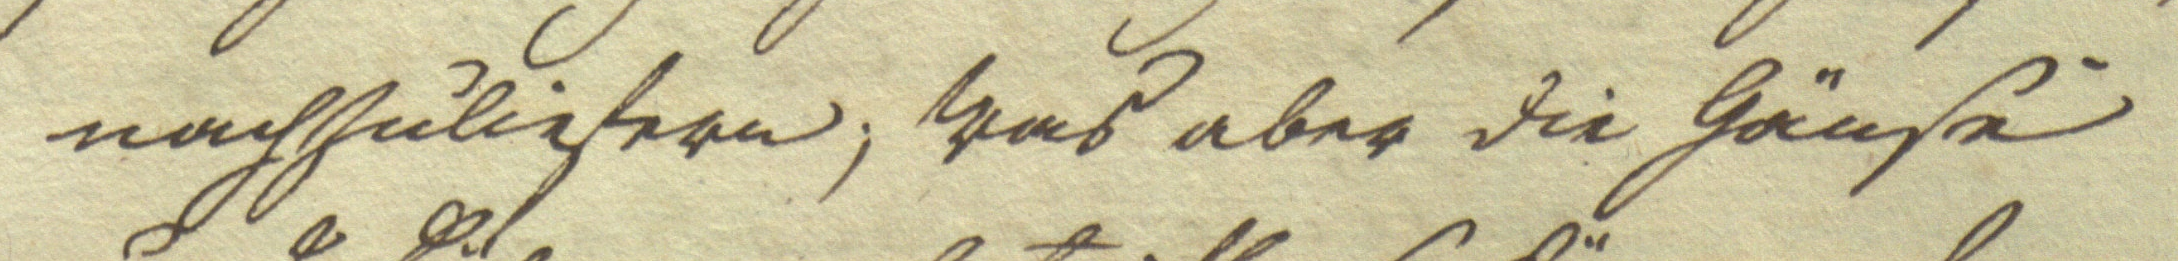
nachzuliefern; was aber die Gänse
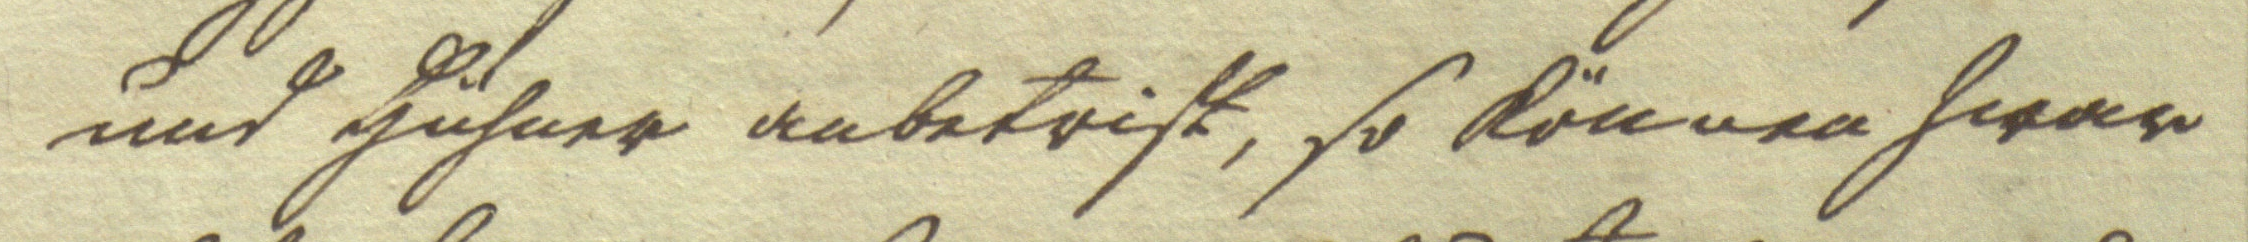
und Hühner anbetrift, so können zwar
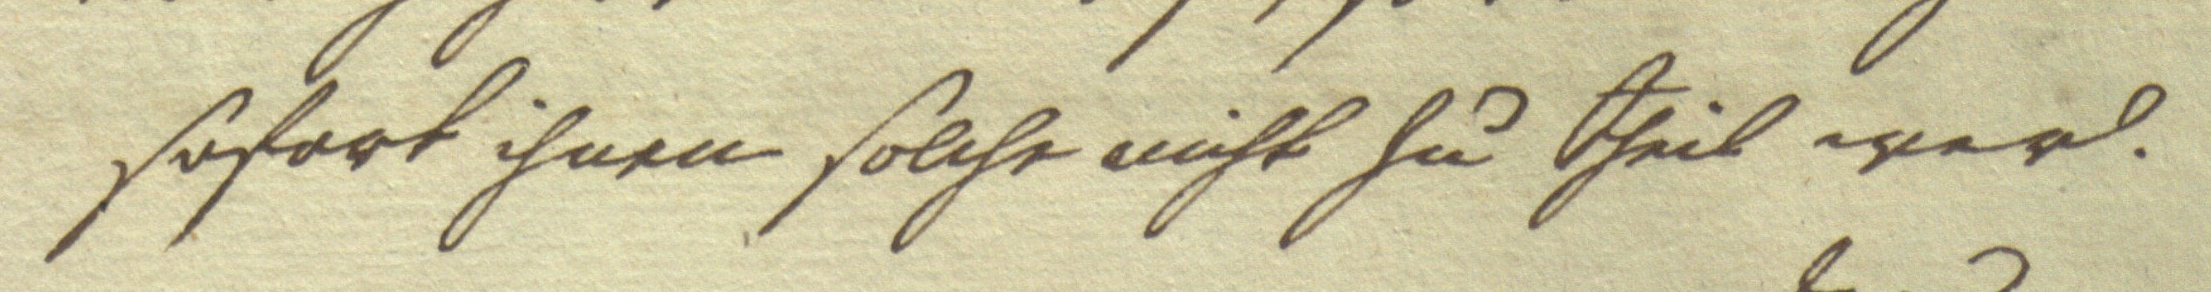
sofort ihnen solche nicht zu Theil wer¬
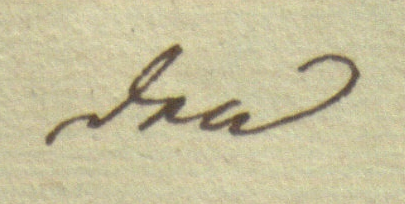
den
